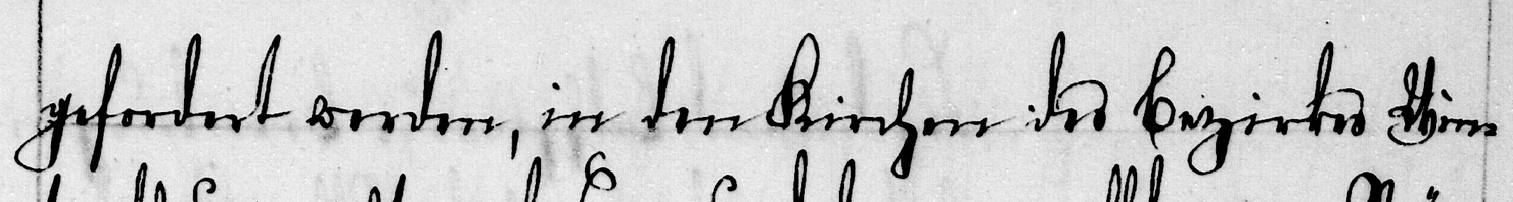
gefordert werden, in den Kirchen des Bezirkes Win¬
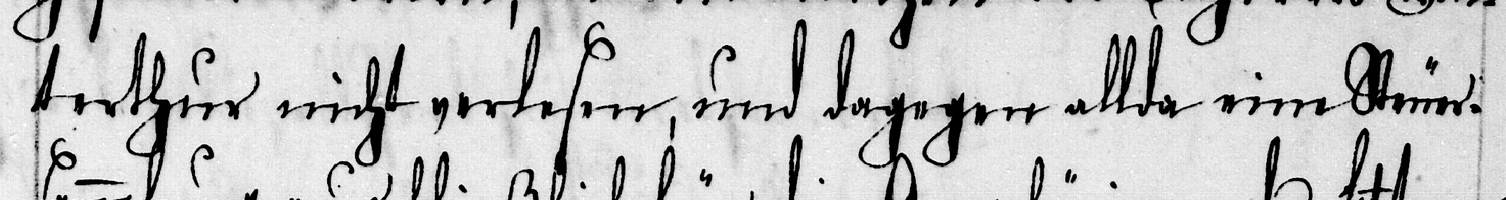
terthur nicht verlesen, und dagegen allda eine Steuer¬
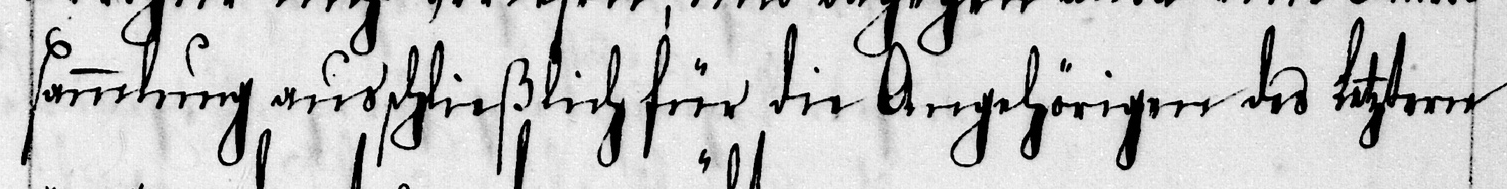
sammlung ausschließlich für die Angehörigen des Letztern
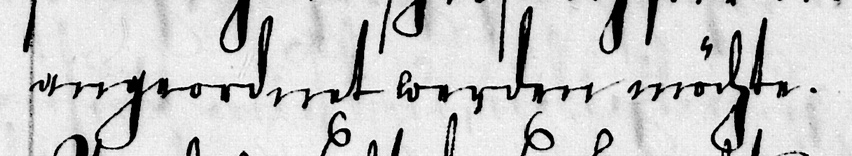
angeordnet werden möchte.
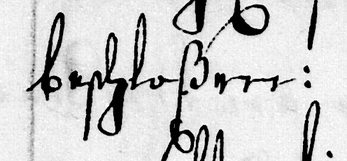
beschloßen:
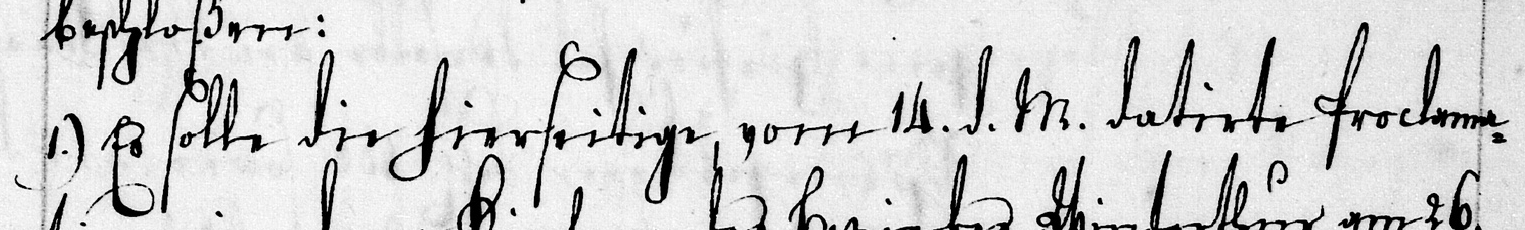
Es solle die hierseitige, vom 14. d. M. datirte Proclam¬
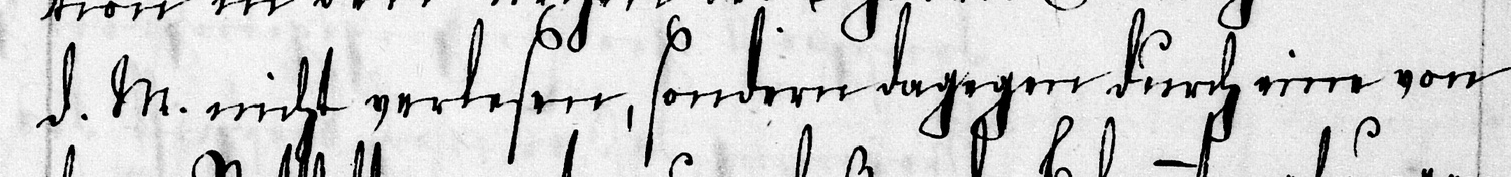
d. M. nicht verlesen, sondern dagegen durch eine von
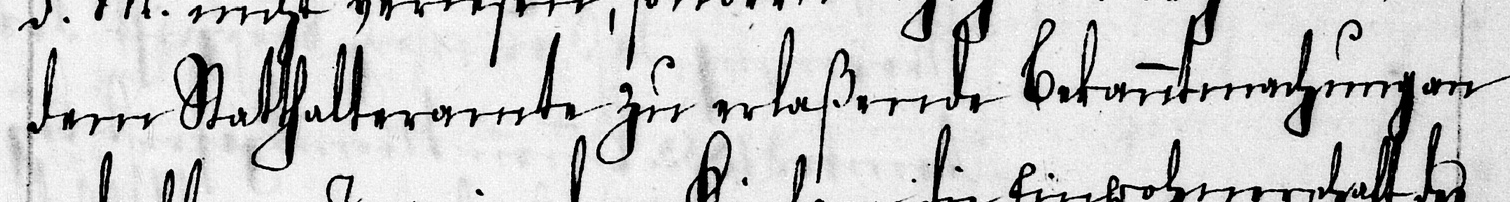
dem Statthalteramte zu erlaßende Bekanntmachung an
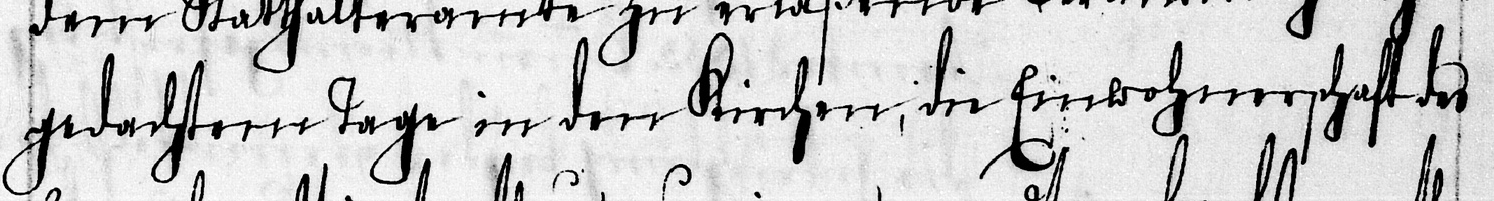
gedachtem Tage in den Kirchen, die Einwohnerschaft des
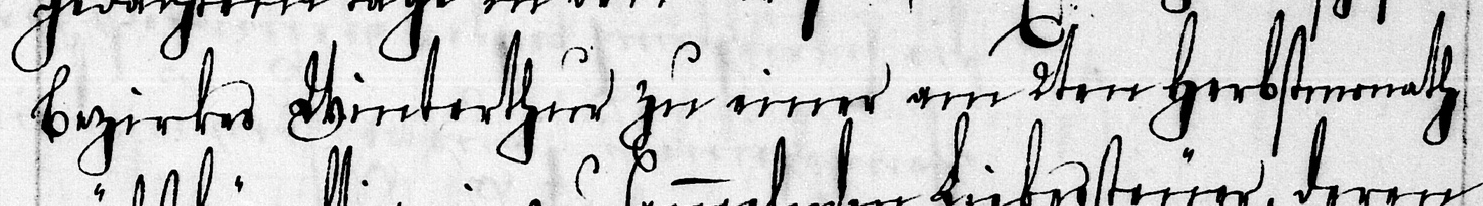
Bezirkes Winterthur zu einer am 2ten Herbstmonath
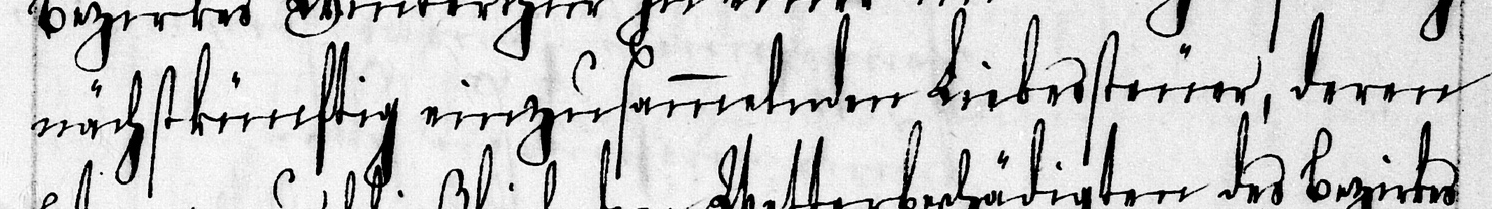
nächstkünftig einzusammelnden Liebessteuer, deren
